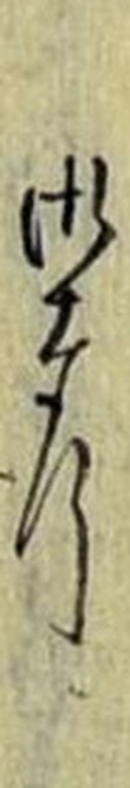御奉行
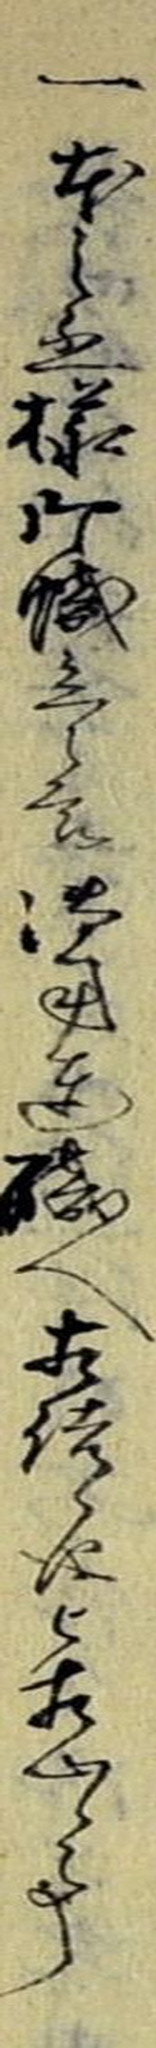一本之丞様御幟立之節御用達職人相詰候儀被相止候事
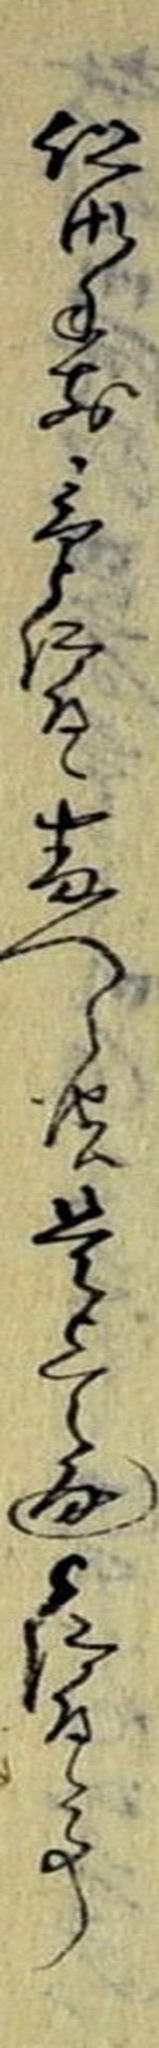但御手前に而被仰付候番人之儀は是迄之通被仰付候事
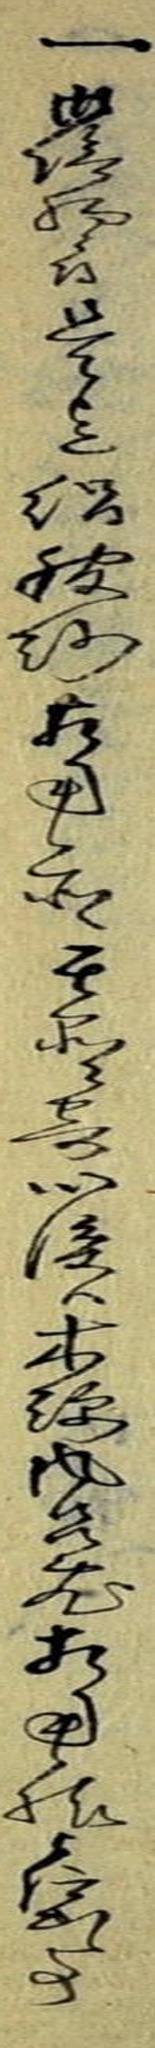一御倹約に付是迄絹服紗相用候所へ其品に寄以後は木綿風呂敷相用候様被仰出候事
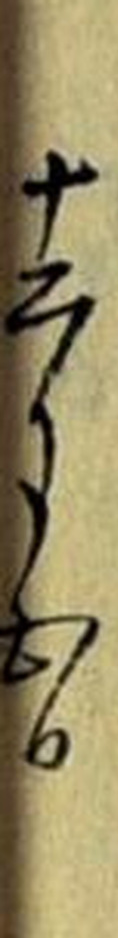十二月五日
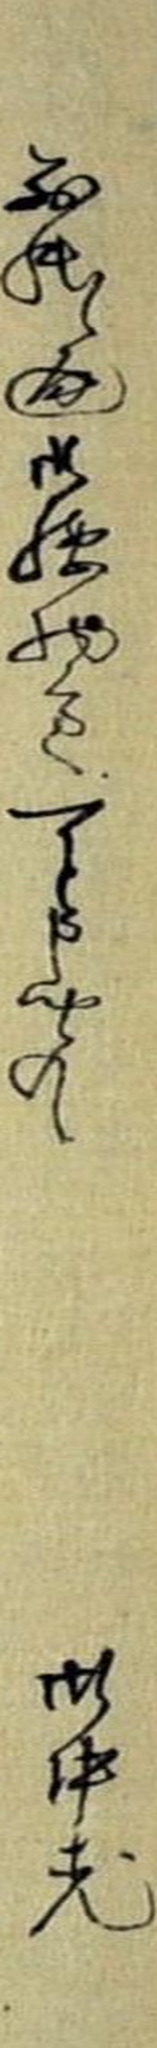別紙之通御腰物方へ可被申聞候御中老
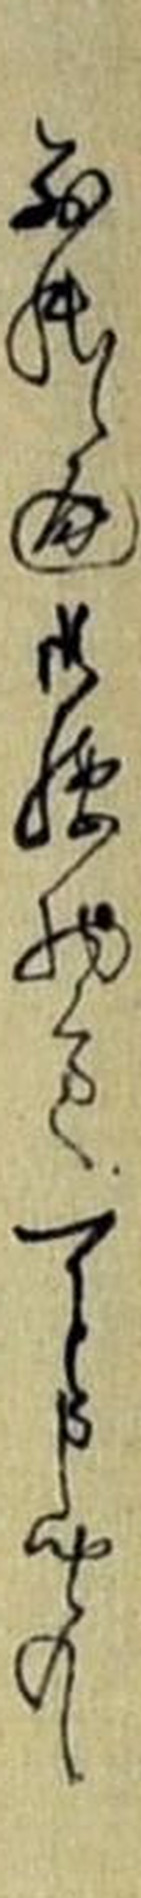別紙之通御腰物方へ可被申聞候御中老
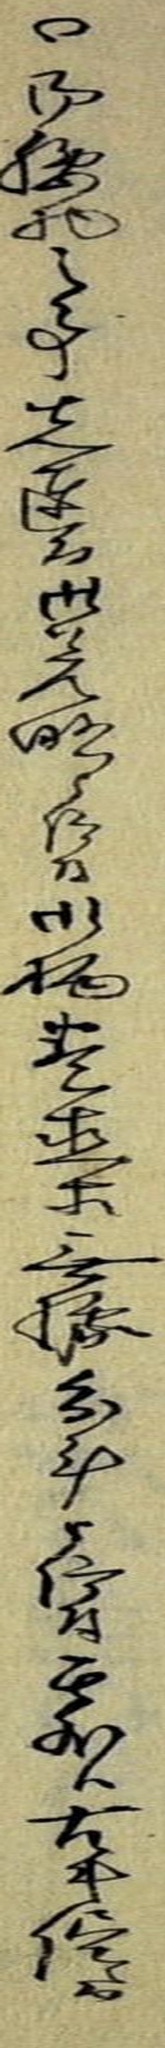○御腰物之事先達而御差略被仰付御柄巻直等無拠分斗被仰付其外は古キ侭に而
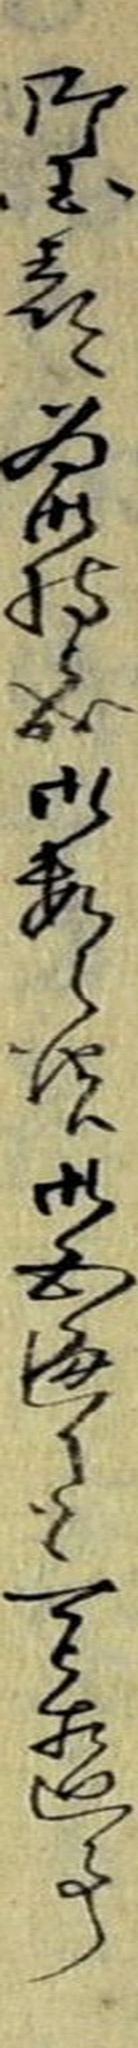御国表へ為御持被成御数之儀は御五通りつヽ可被相廻事
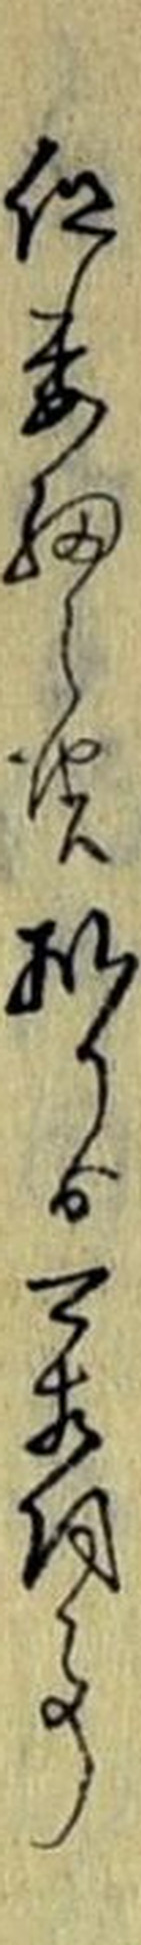但委細之儀は掛りゟ可相伺事
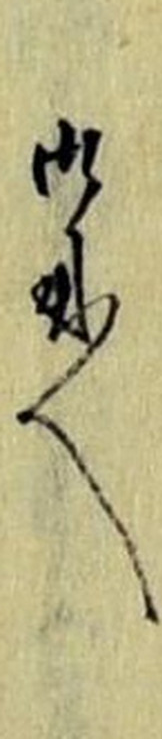御用人
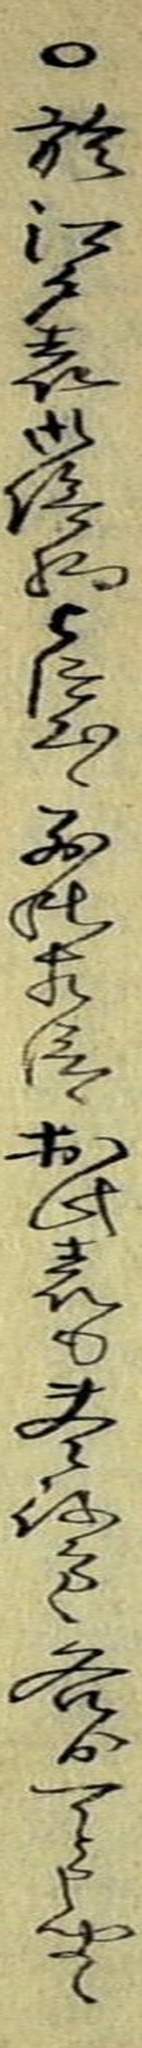○於江戸表御倹約被仰出候別紙相渡候於此表も夫々役方へ各ゟ可被申聞候
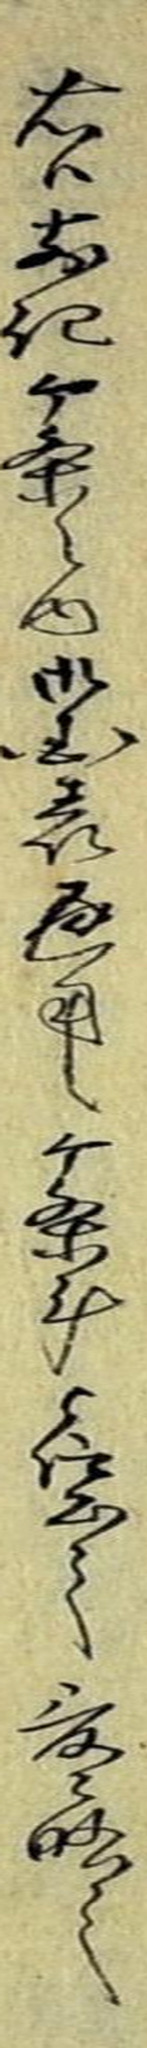右は前記ヶ条之内御国表通用之ヶ条斗被仰出之爰に略之
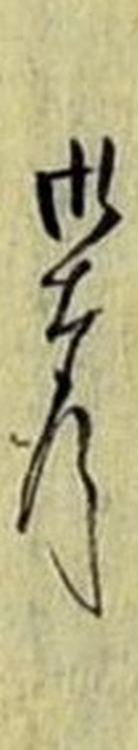御奉行
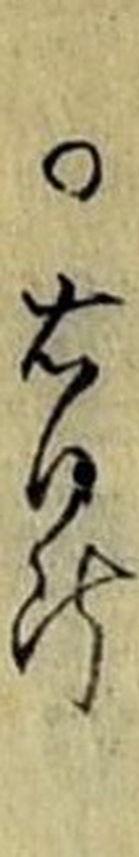○右同断
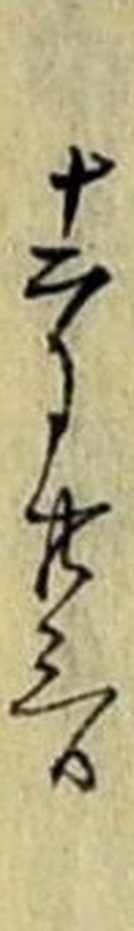十二月廿三日
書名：命令之部 四
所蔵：福井県文書館 Fukui Prefectural Archives
